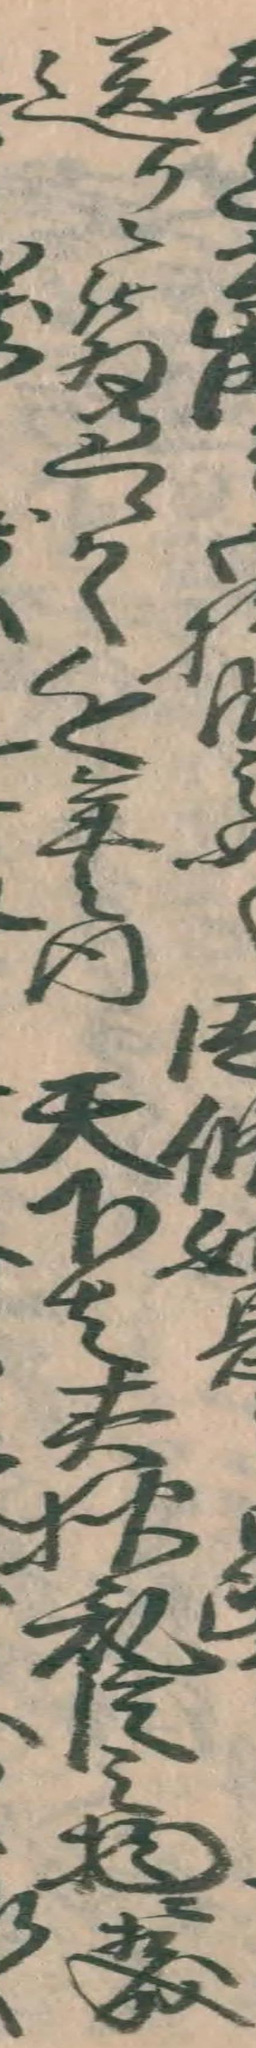送りニ被為過候ハヽ近年之内天下者夷狄乱臣之物ニ相成
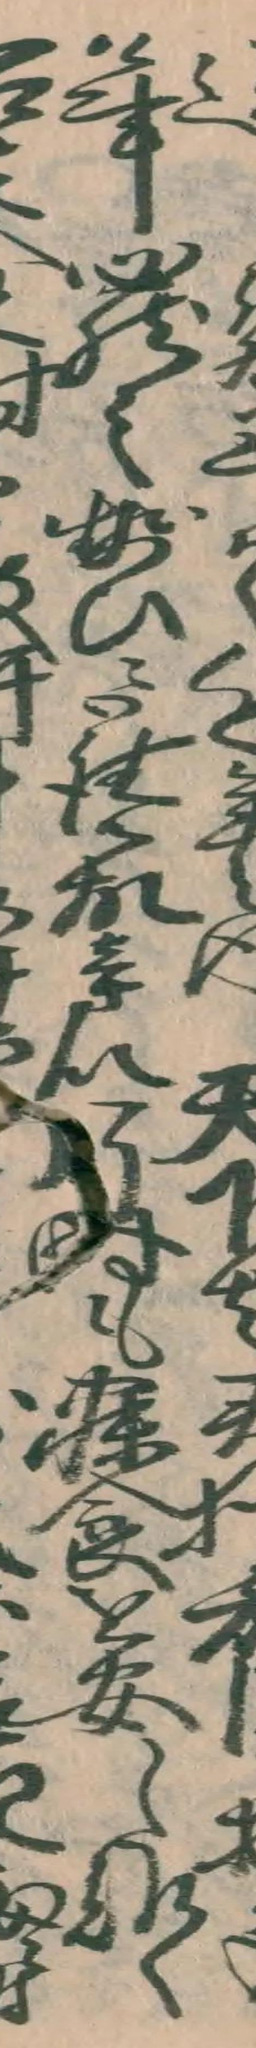候事必然之勢ひニ御座候故旁以片時も寝食を安し難く
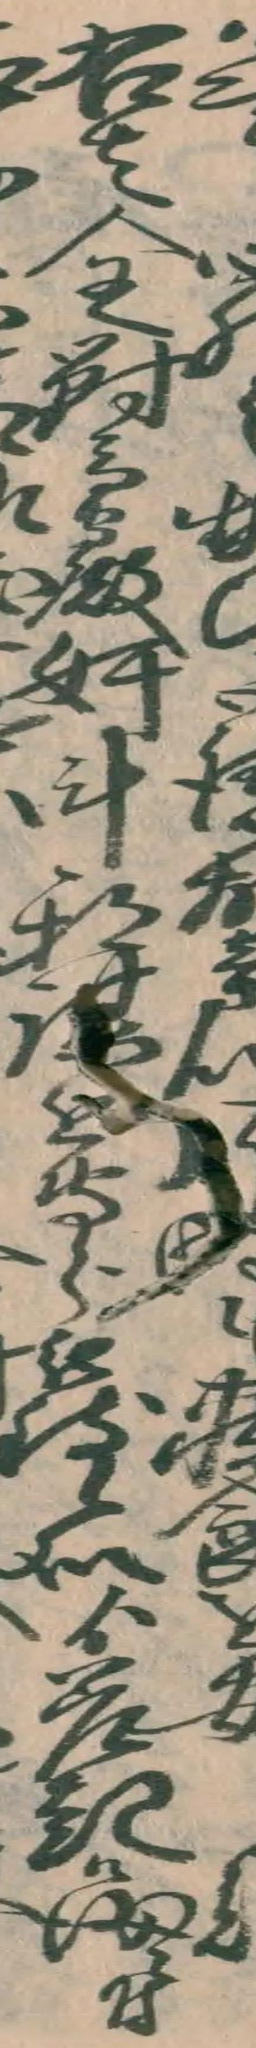右者全對馬守殿奸斗邪謀を専ら被致候処ゟ差起候儀ニ付
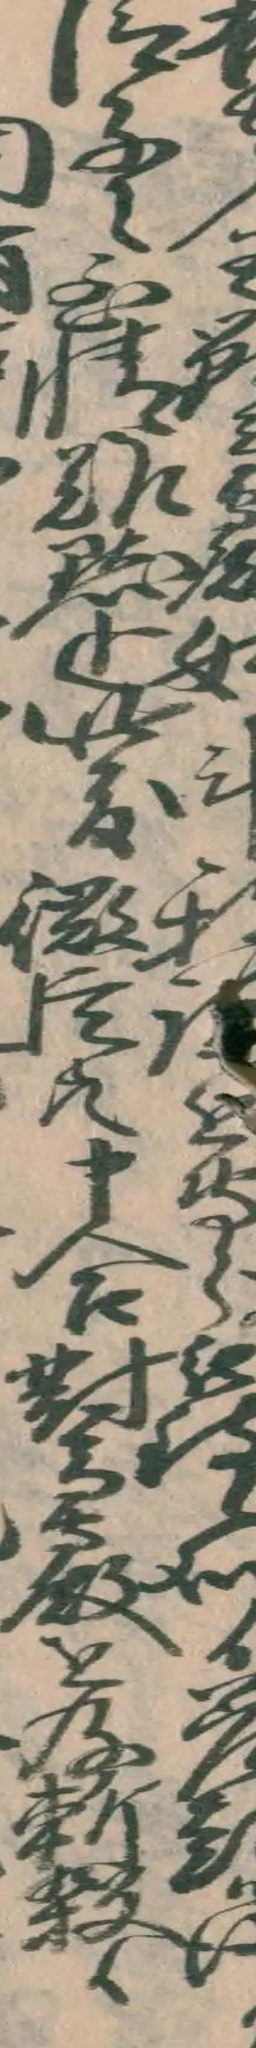臣子之至情難黙止此度微臣共申合對馬守殿を及斬殺候
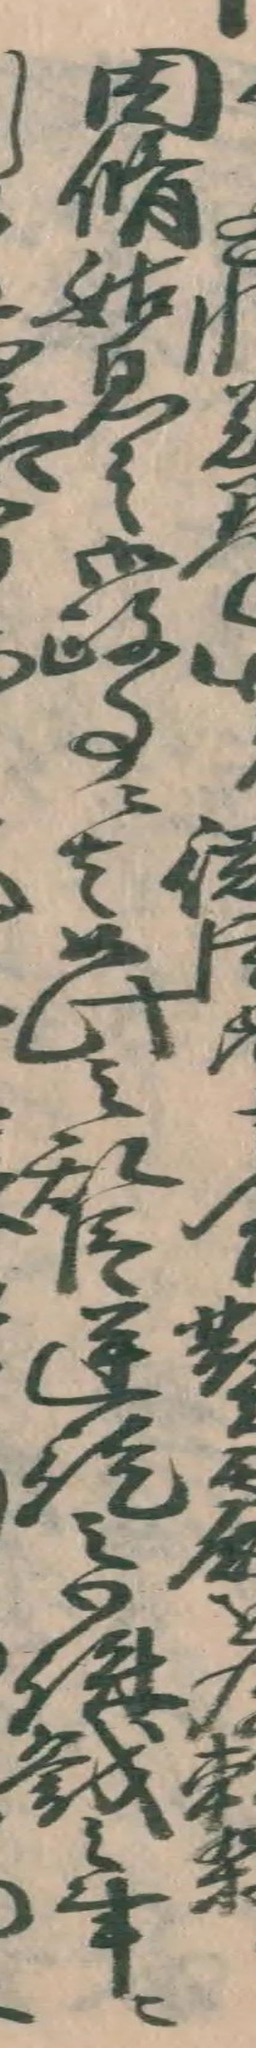因脩姑息之御政事ニ者如此之乱臣逆徒之御誅戮之事ニ
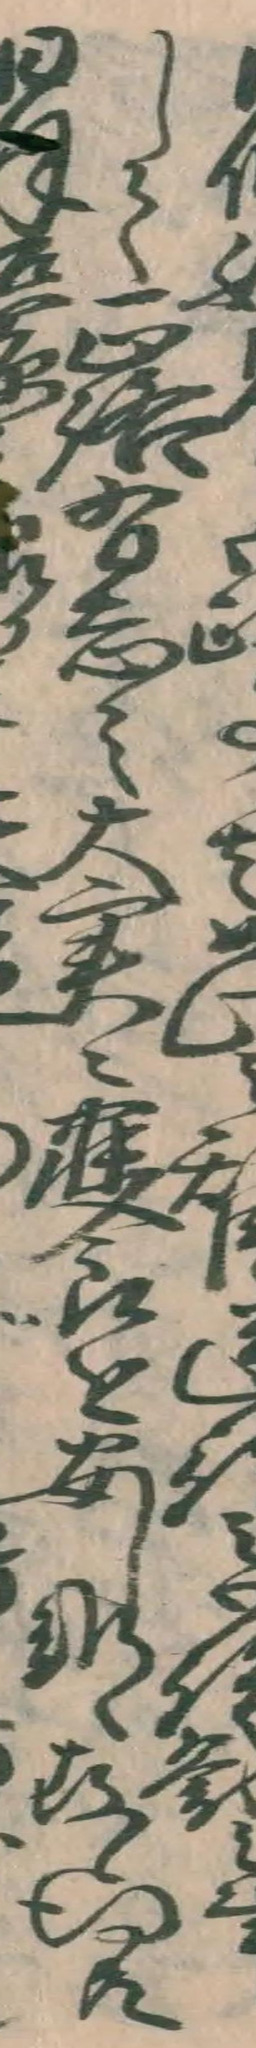して正路有志之大実ニ寝食を安し難く存候得共
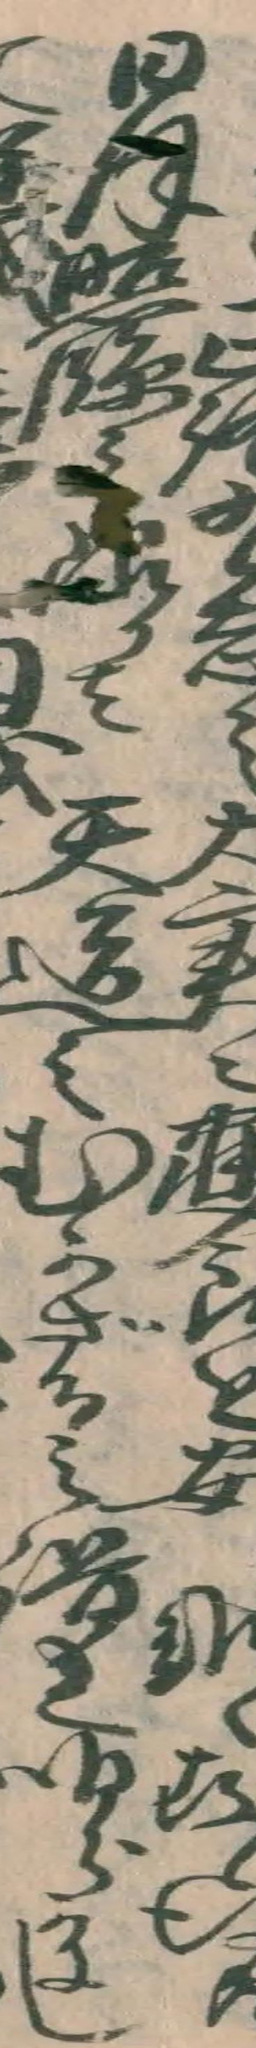日月照臨之限り者天道之むかざる之謂れ明らかにし
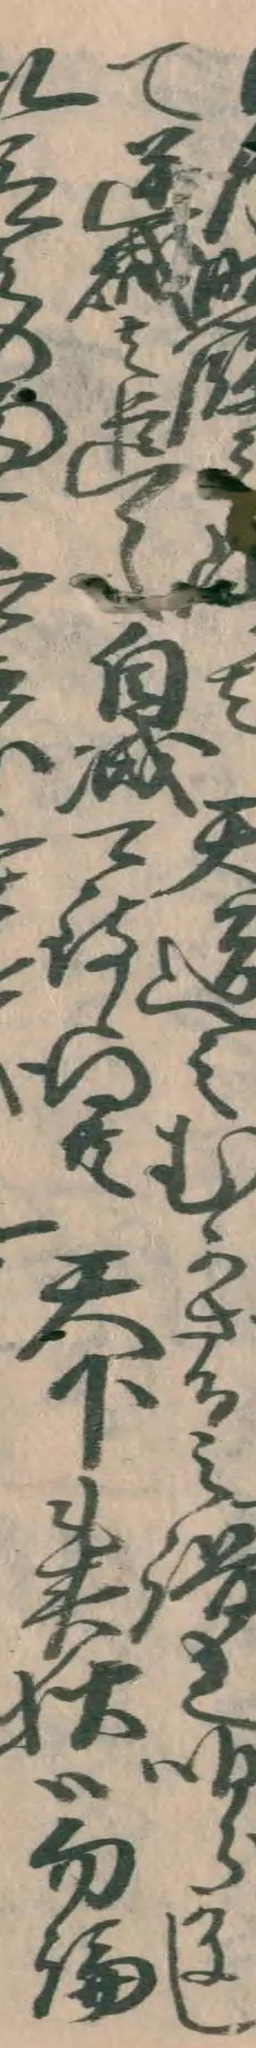て逆賊者追々自滅可致候得共天下も夷狄ハ勿論
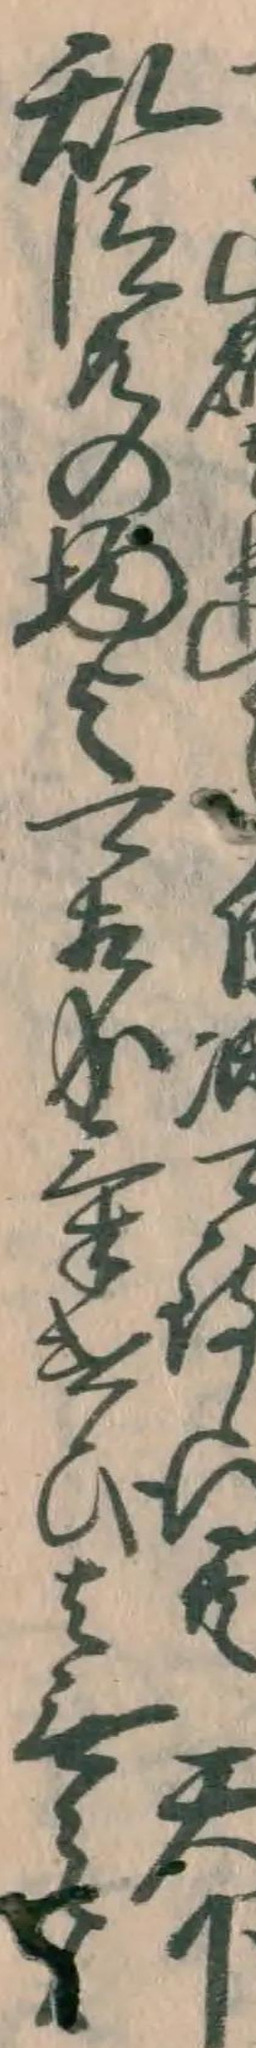乱臣共の物と可相成氣遣ひ者無之候
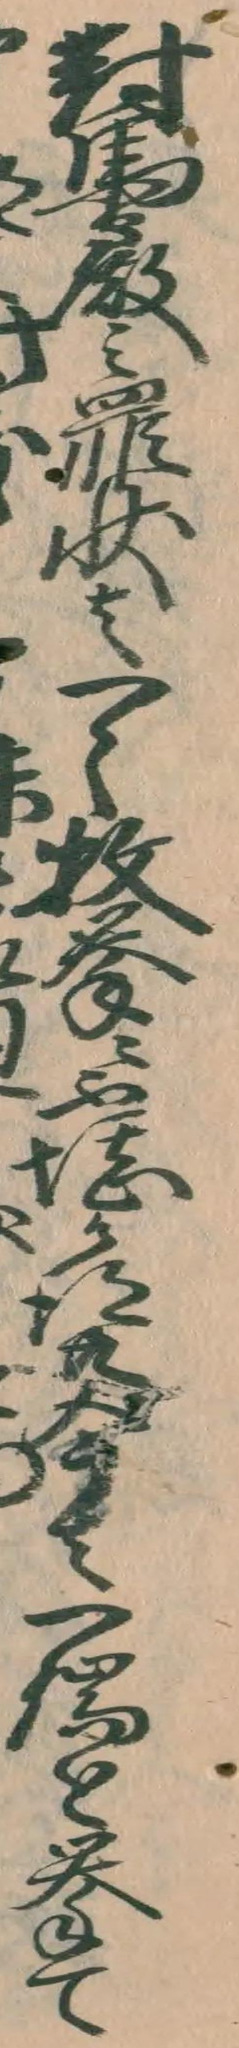對馬守殿之罪状者一々枚挙ニ不堪候得共今者一端を挙て
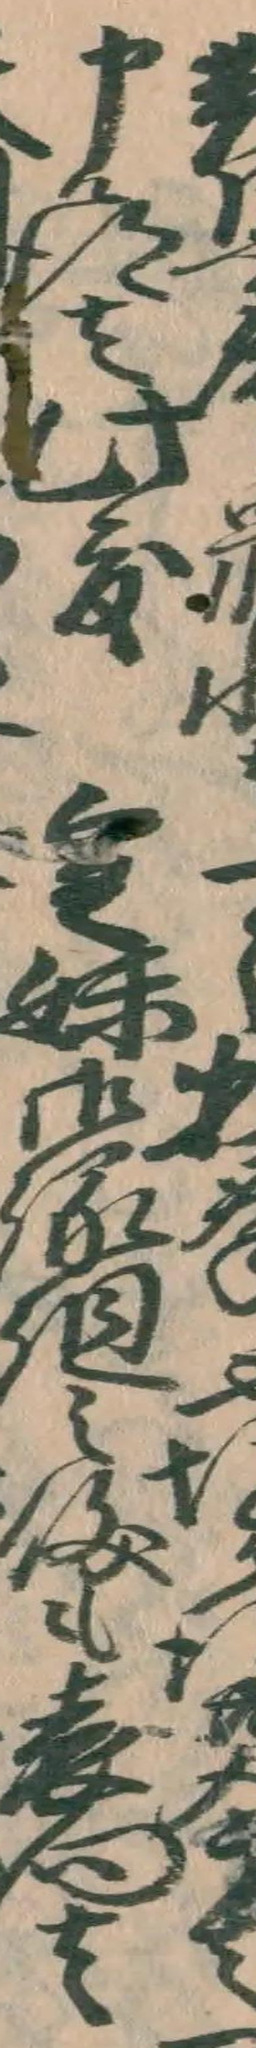申候得者此度皇妹御縁組之儀も表向者
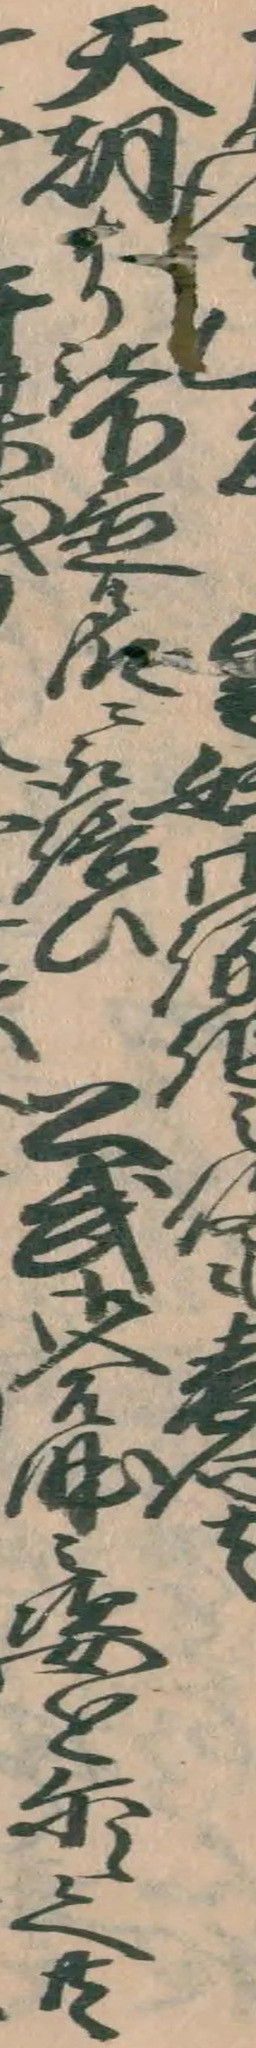天朝より被下置候様ニ取繕ひ公武御合体之姿を示し候へ共
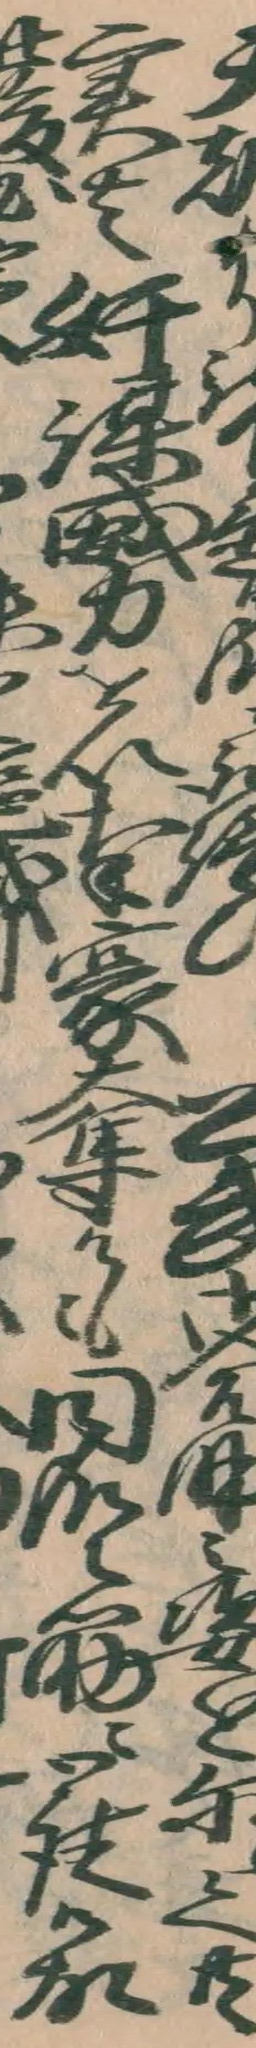実者奸謀威力を以奉豪奪候も同様之筋ニ御座候故
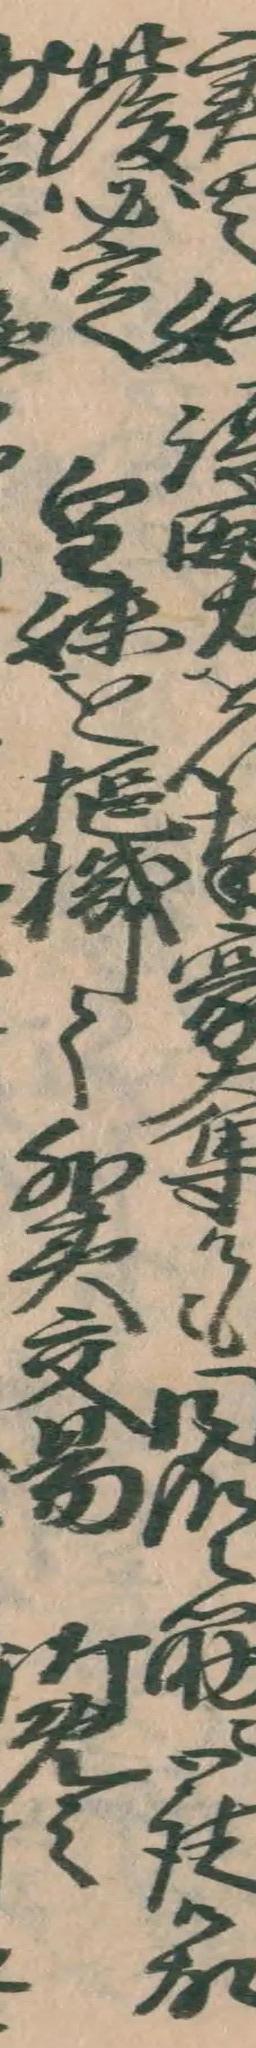此後必定皇妹を樞機して外夷交易御免之
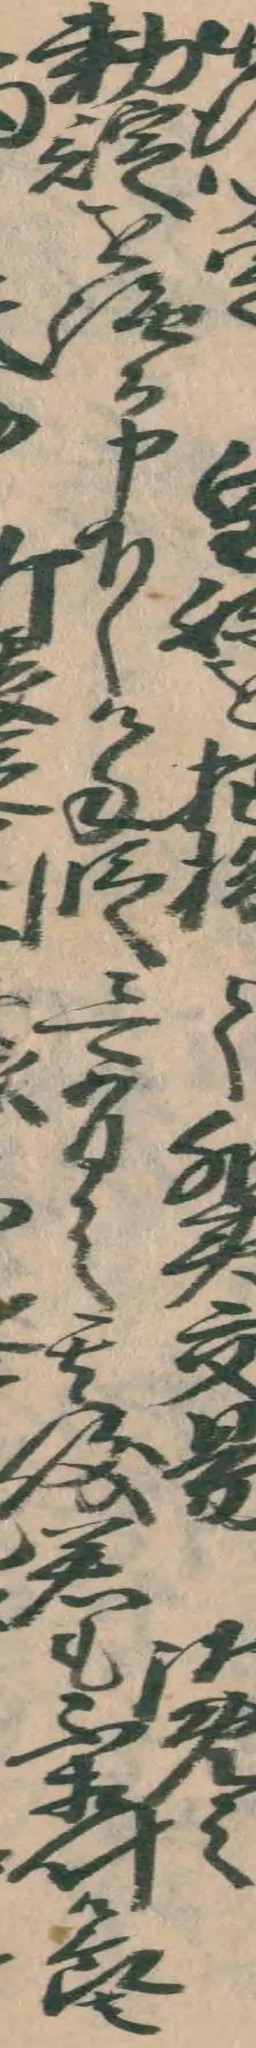勅諚を強而申下し候手段ニ可有之其儀若も不相叶候節者
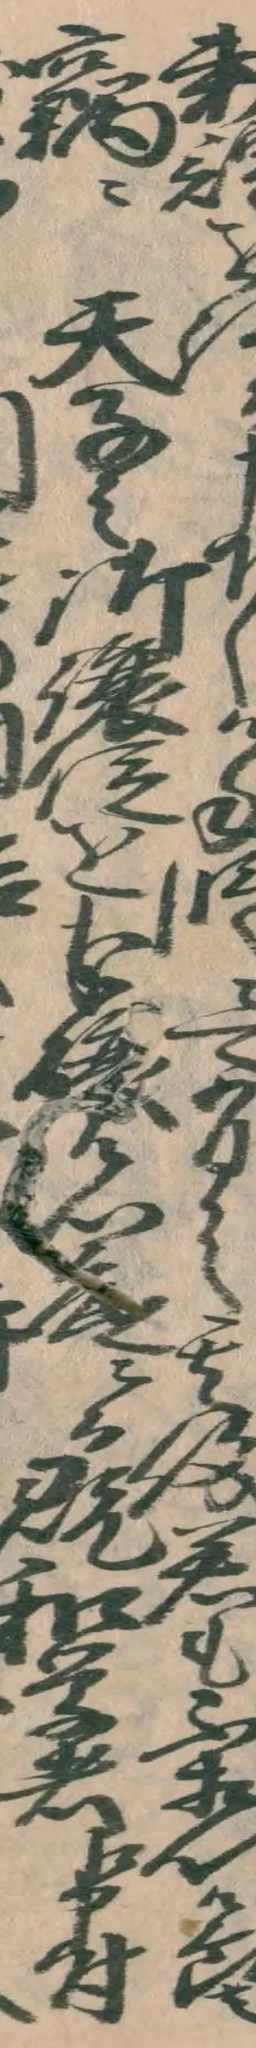竊ニ天子之御譲位を奉醸候心底ニ而既和学者江申付
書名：麗斎叢書. 20
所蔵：国立国会図書館 National Diet Library, JAPAN
